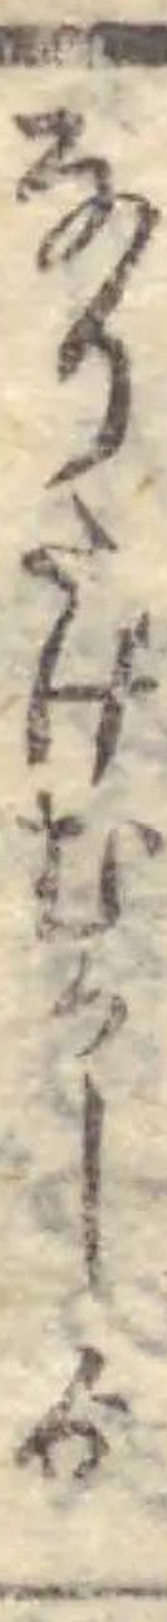なりたけむかしより
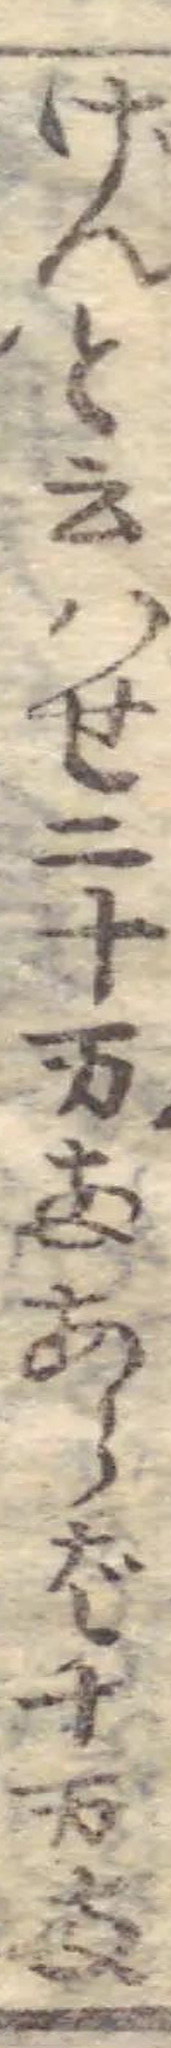げんと云はせ二十万両あらば千万両
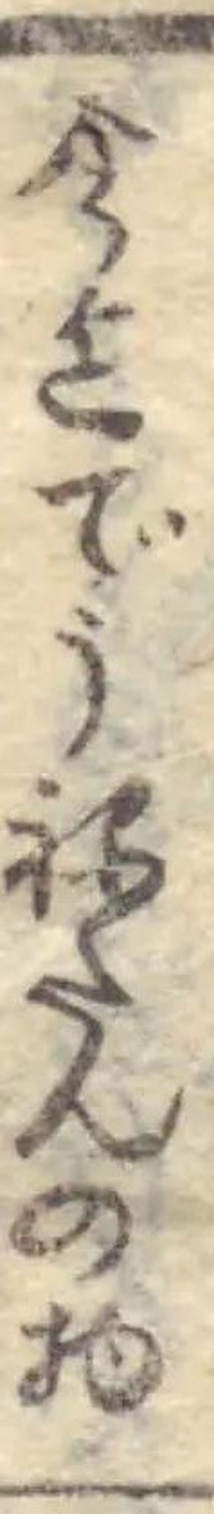今迄でうねたんの物
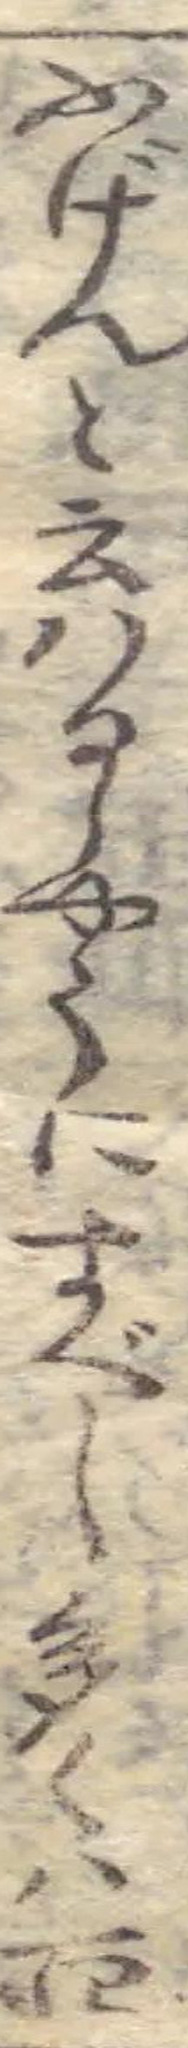ふげんと云はるゝやうにすべし多くは百
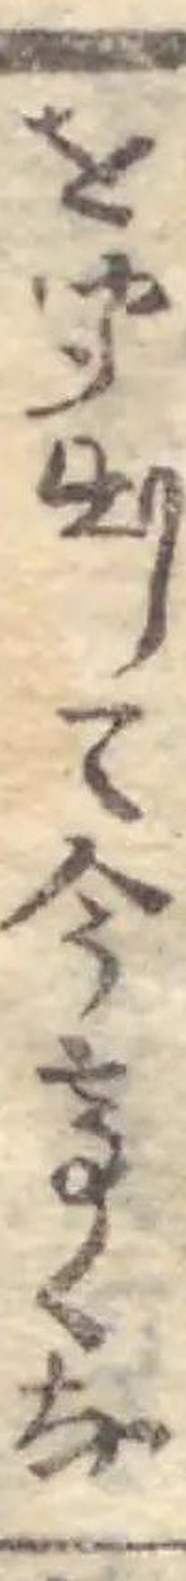を聞出して今高くな
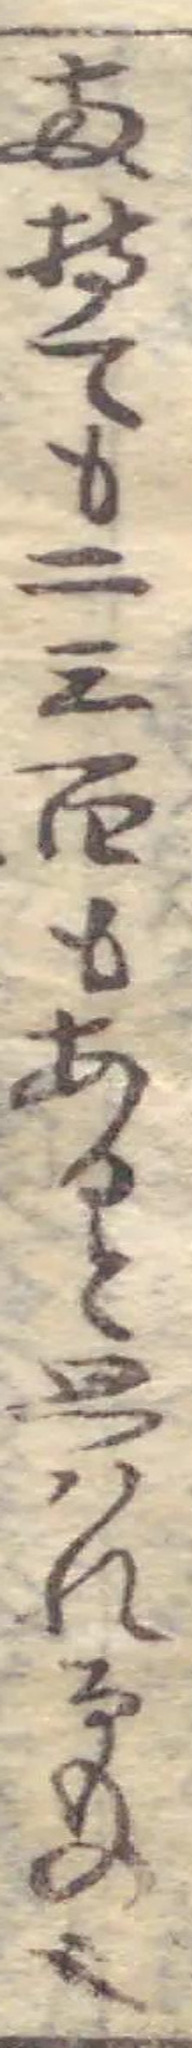両持ても二三百もあると思はれるもの也
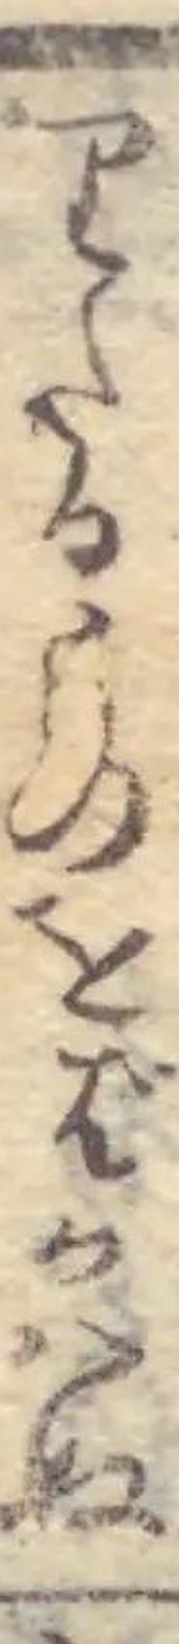りたるものをばかはぬ
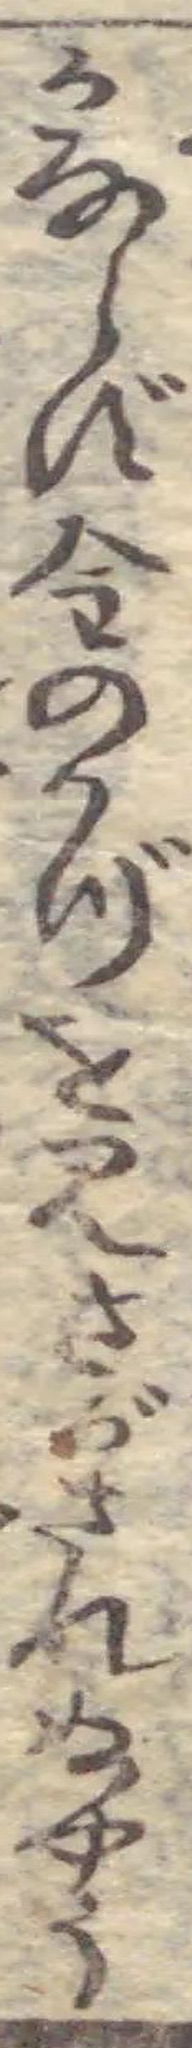かならず金のかづを見さがされぬやう
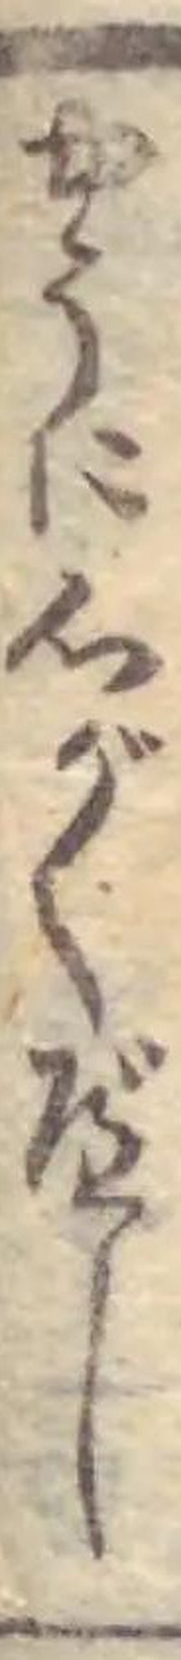やうに心がくべし
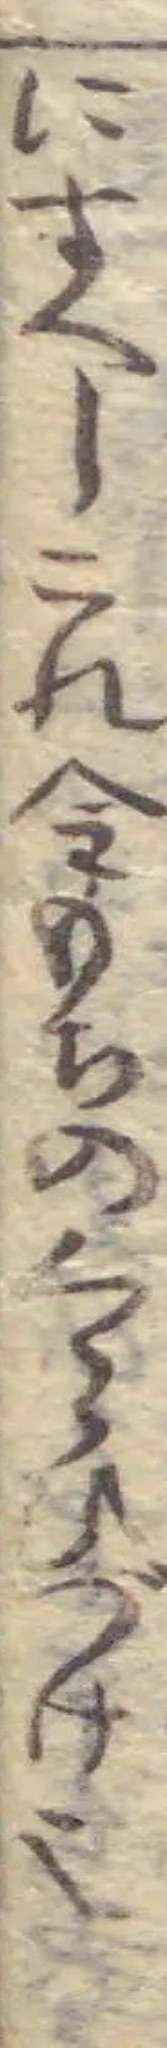にすへしこれ金もちのくらひづけ也
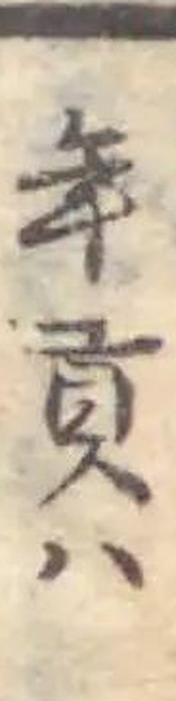年貢は
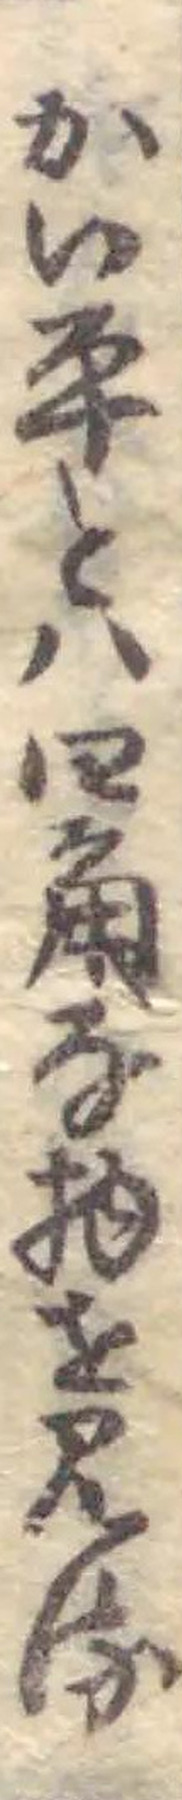かい平とは四角な物を見る
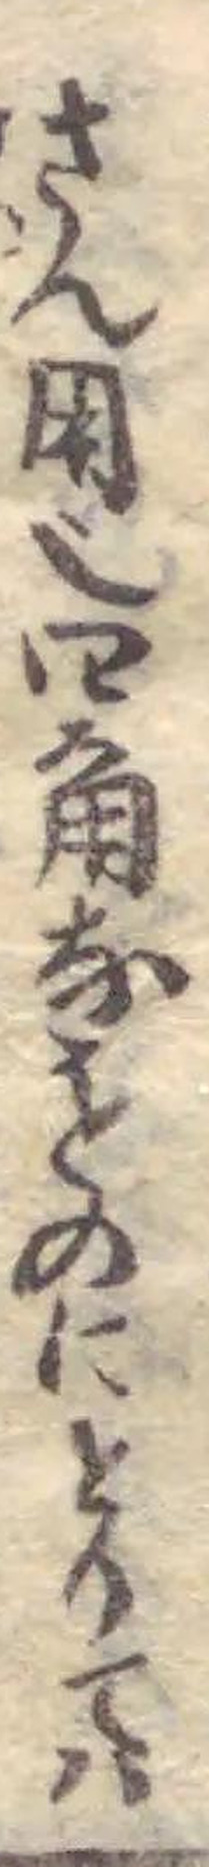さん用也四角なものにとりては
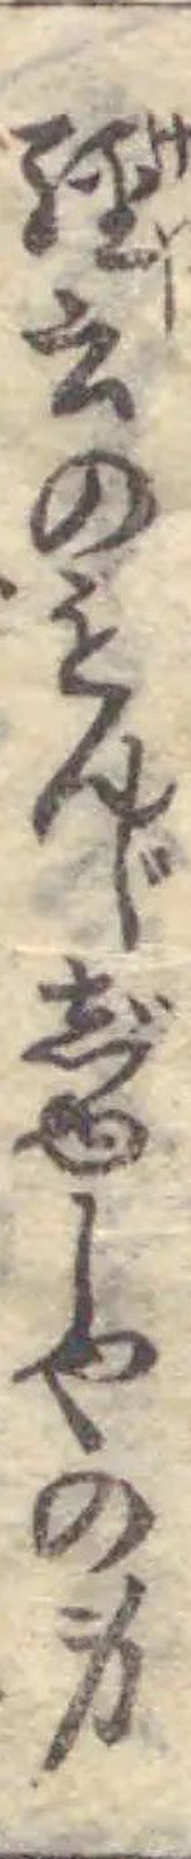経書のもんじじゆしやの身
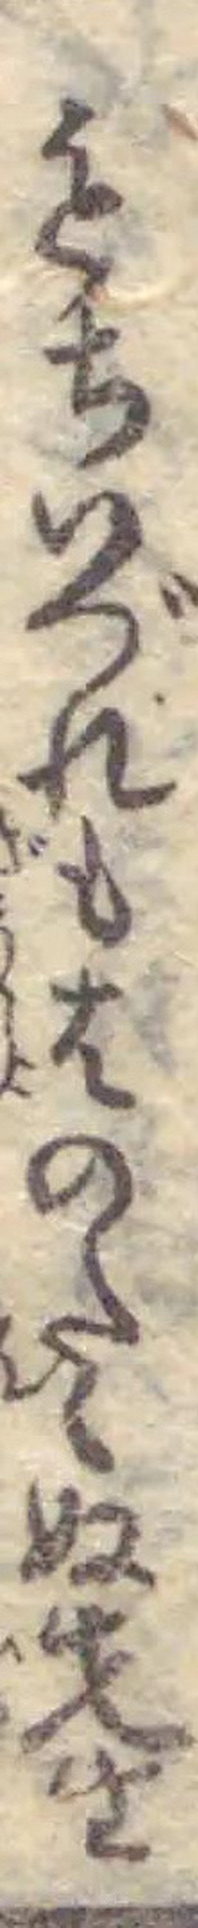もちいづれもはのたゝぬ先生
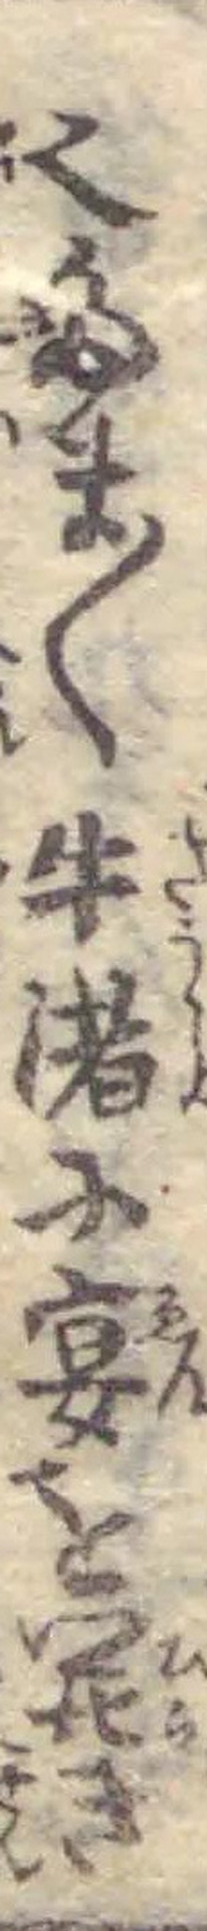也たま〳〵牛渚に宴を開き
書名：大通人好記
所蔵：国立国会図書館 National Diet Library, JAPAN
